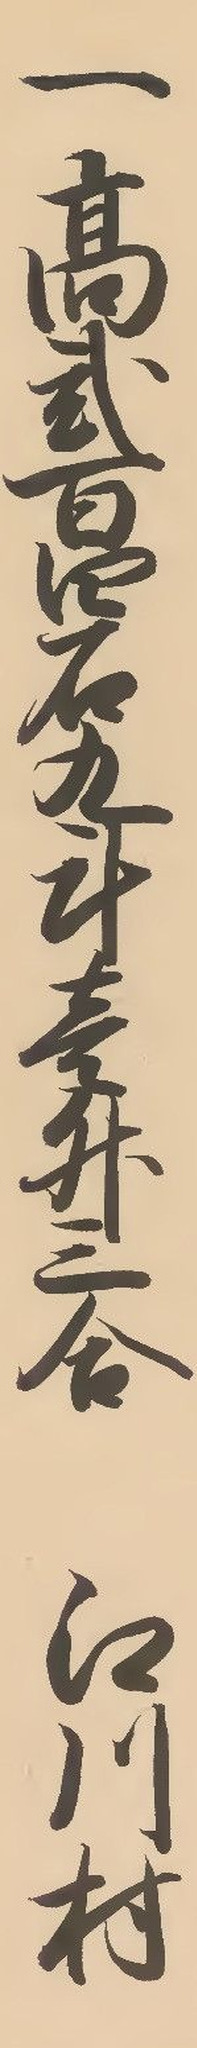一高弐百四石九斗壱升三合江川村

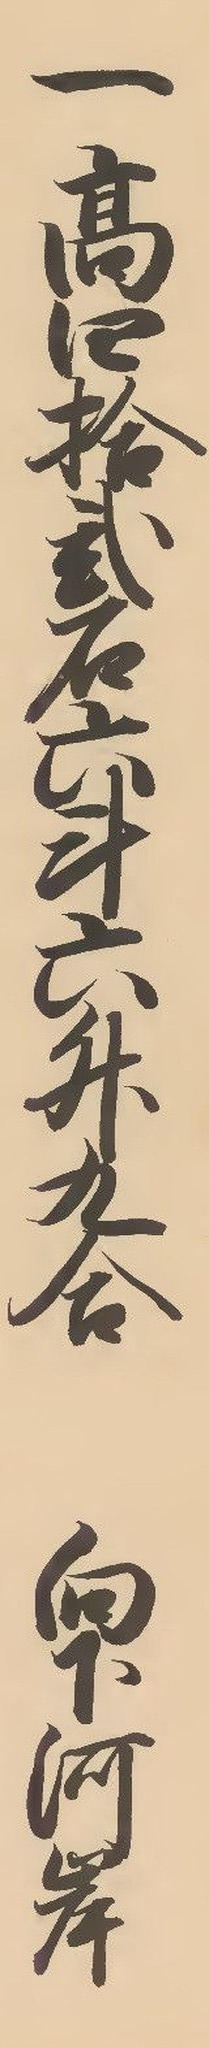一高四拾弐石六斗六升九合向下河岸
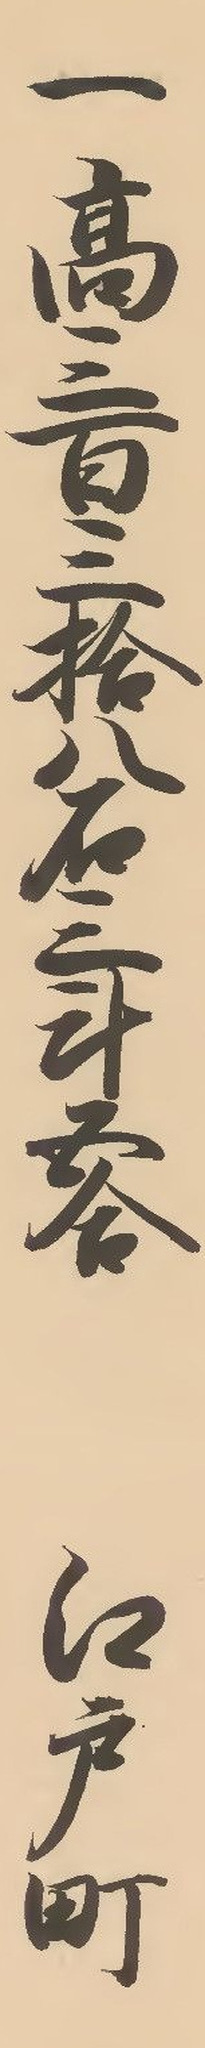一高三百三拾八石三斗五合江戸町
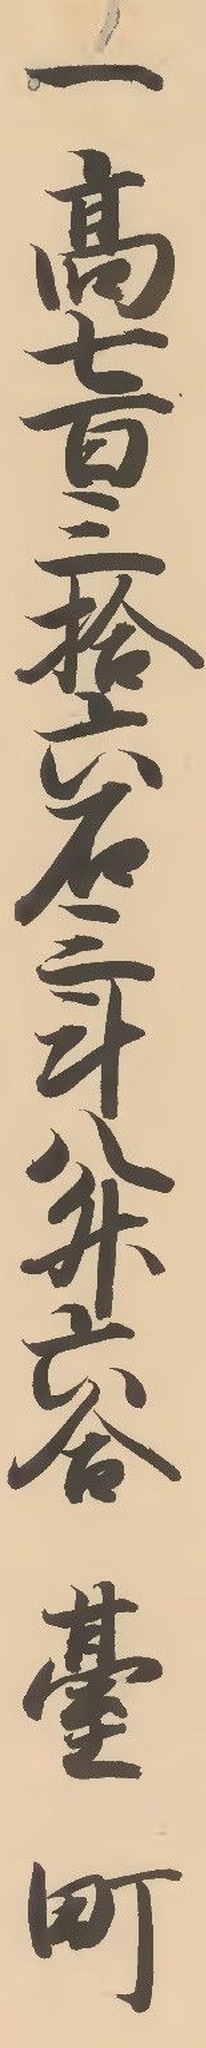一高七百三拾六石三斗八升六合台町
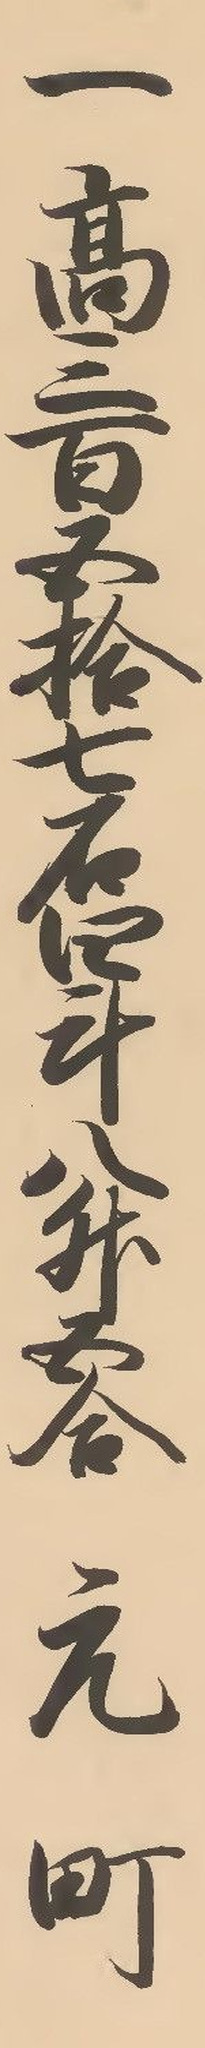一高三百五拾七石四斗八升五合元町
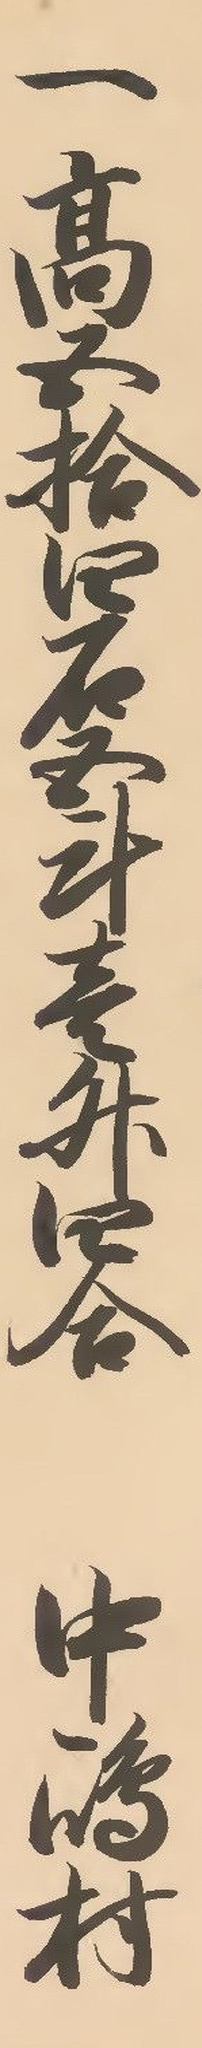一高五拾四石五斗壱升四合中島村
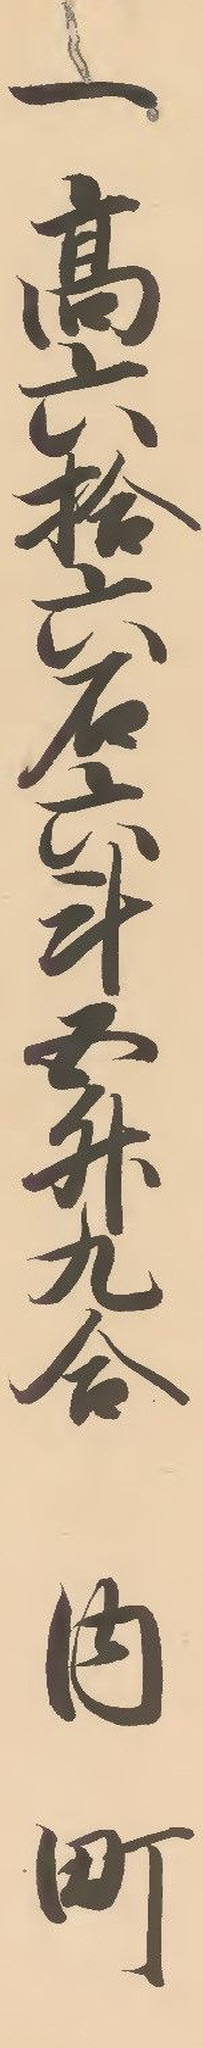一高六拾六石六斗五升九合内町
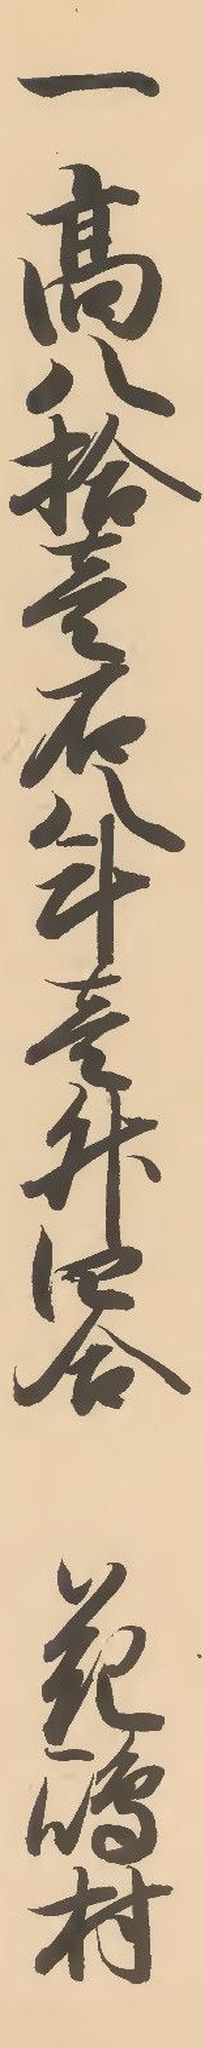一高八拾壱石八斗壱升四合花島村
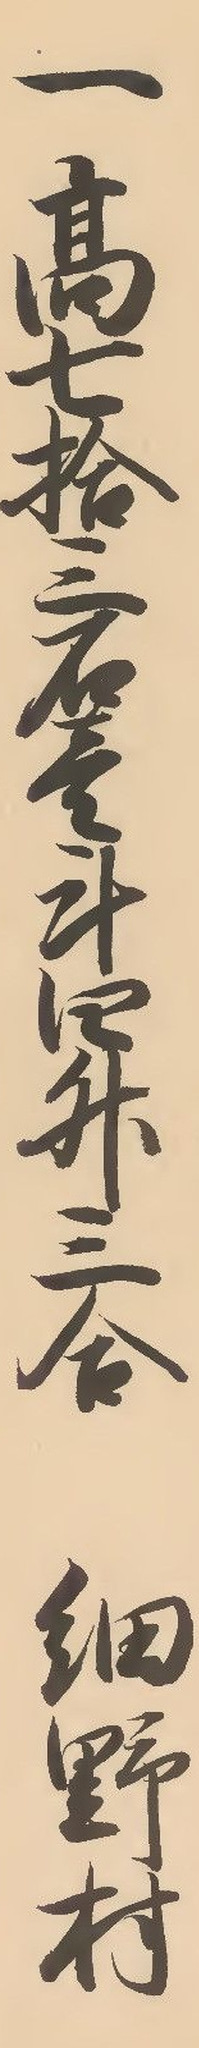一高七拾三石壱斗四升三合細野村

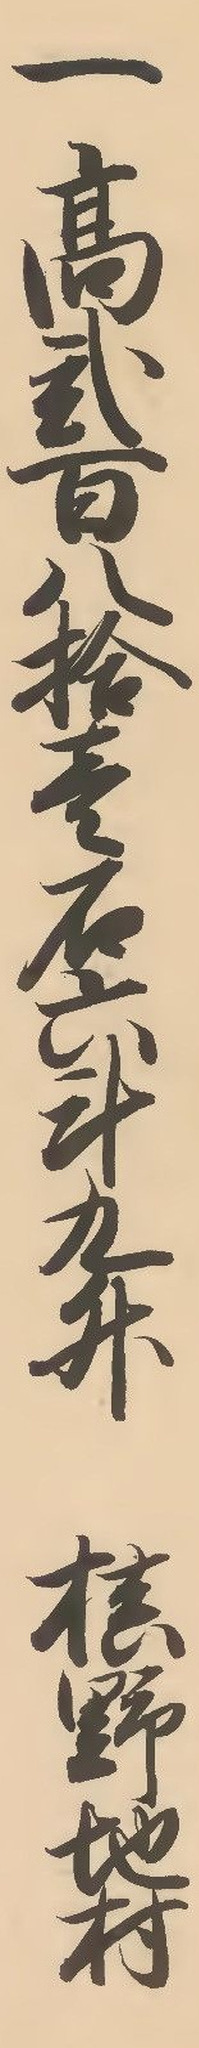一高弐百八拾壱石六斗九升槙野地村
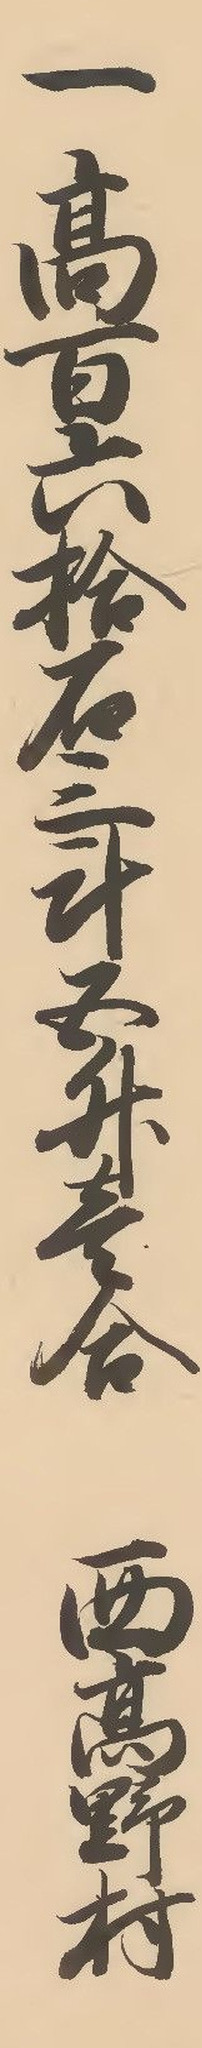一高百六拾石三斗五升壱合西高野村
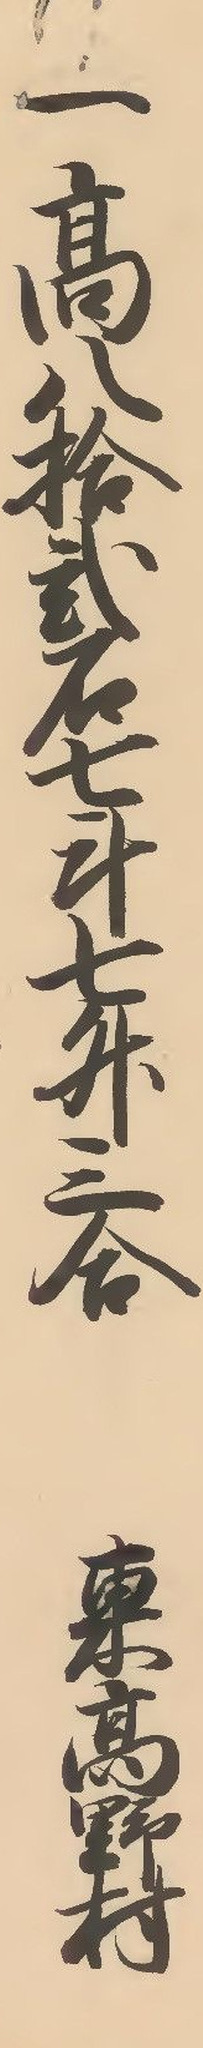一高八拾弐石七斗七升三合東高野村
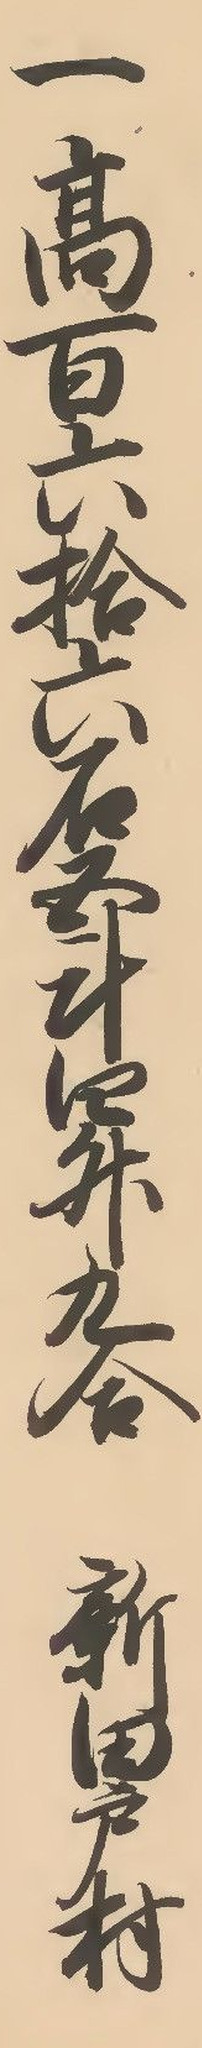一高百六拾六石五斗四升九合新田戸村
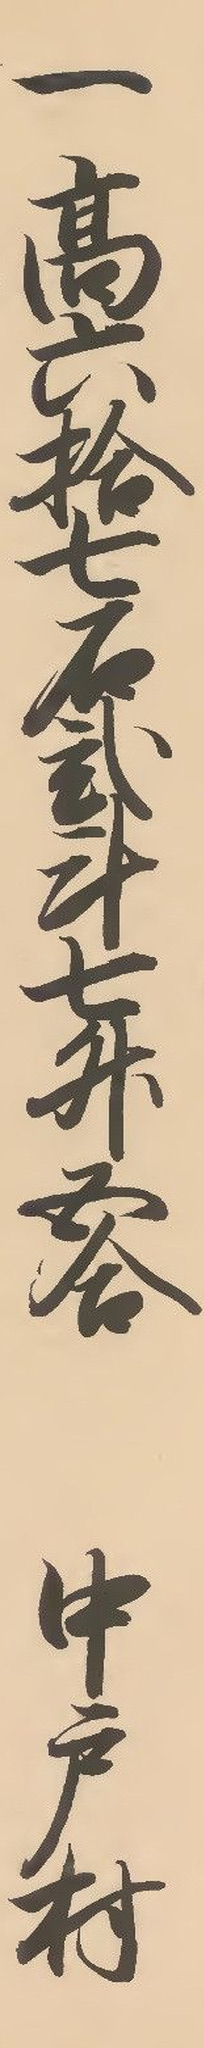一高六拾七石弐斗七升五合中戸村
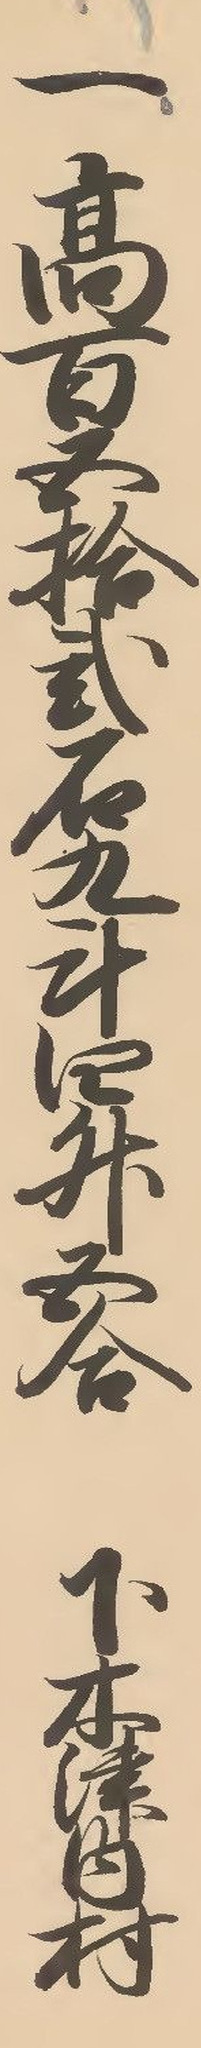一高百五拾弐石九斗四升五合下木津内村
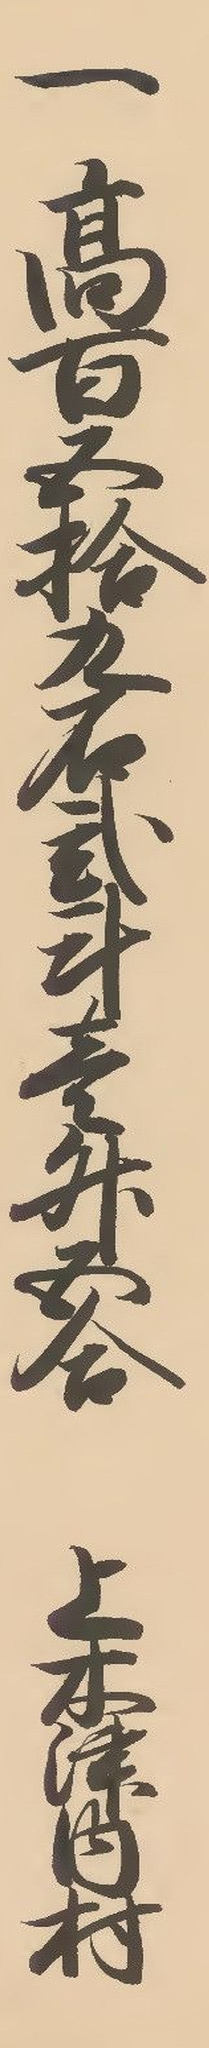一高百五拾九石弐斗壱升五合上木津内村
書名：下総国郷帳
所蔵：国立公文書館 National Archives of Japan
